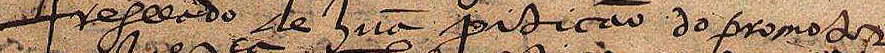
tresllado de huā piticão do promotor
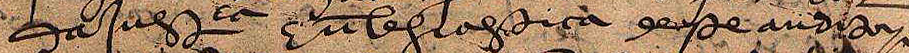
da Justca Ecclesiastica deste auditorjo
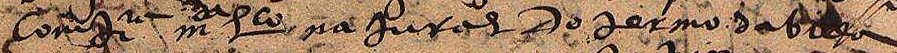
Comtra mda Lco natural do termo da villa
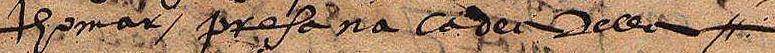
thomar / presa na cadea della
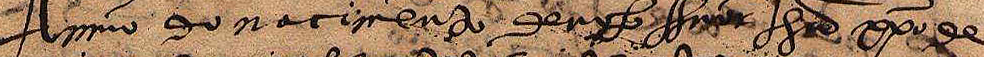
Anno do nacimento de noso ssnor̄ Jhū xp̄o de
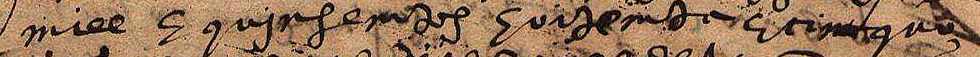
mill E qujnhemtos E oitemta E cimquo
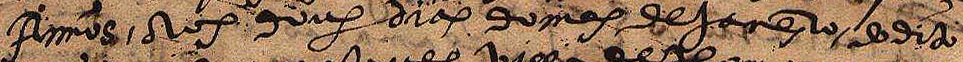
Annōs, Aos dous dias do mes de Janejro / do dito
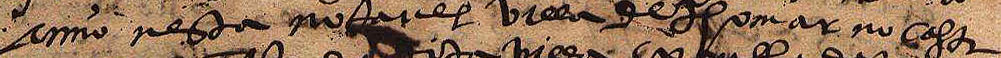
annō nesta notauel villa de thomar no caste
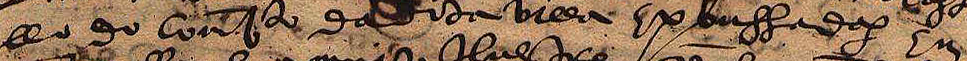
llo do con̄vto da dita villa E poussadas Em
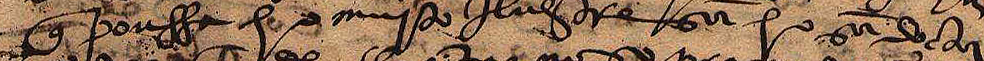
q̄ poussa ho mujto Jlustre sor̄ ho sōr doctor
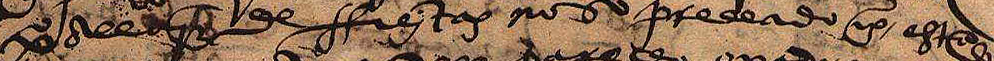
po Allur̄z de ffrejtas noso prellado c̄ꝭ / estādo
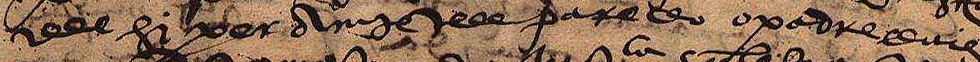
elle hi perAmte elle pareceo o padre lluis
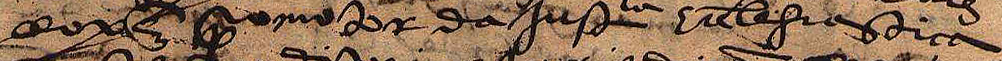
llopes promotor da Justca Ecclesiastica
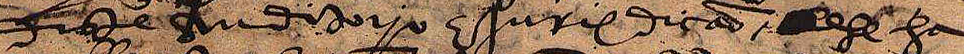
deste Auditorjo E Jurisdicaõ, _ lhe ha
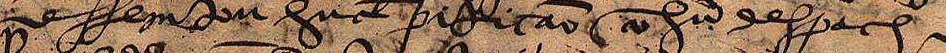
pressemtou huā pitição c̄o hū despacho
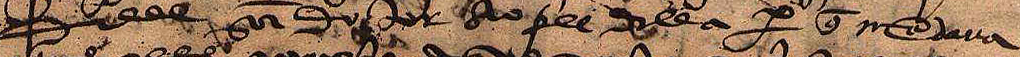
delle sor̄ doctor Ao pee della ꝑ q̄ mādaua
